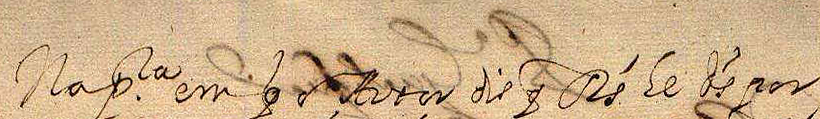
Na p.ra em q̄ o Autor dis q̄ Ds̄ he ds̄ por
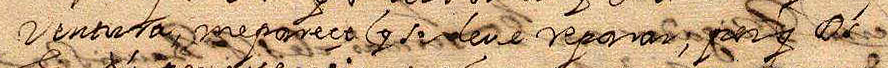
ventura, me parece q̄ se deue reparar, porq̄ Ds̄
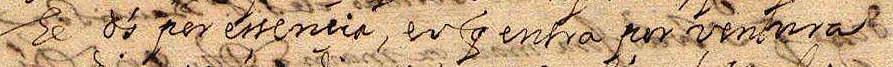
he ds̄ per essencia, e o q̄ entra por ventura
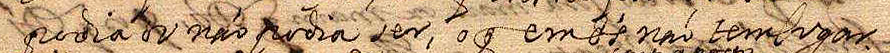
podia ou naõ podia ser, o q̄ em ds̄ naõ tem logar
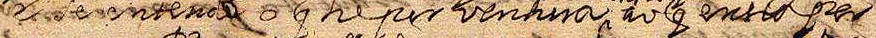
e se entend o q̄ he por ventura ao q̄ entra por
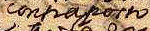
contraposto
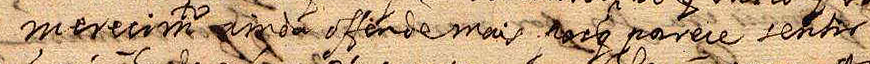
merecimto ainda offende mais porq̄ parece sentir
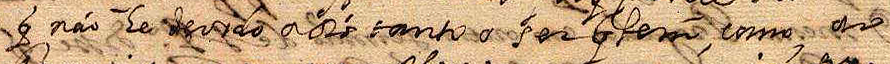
q̄ naõ he devido a Ds̄ tanto o ser q̄ tem, como ao
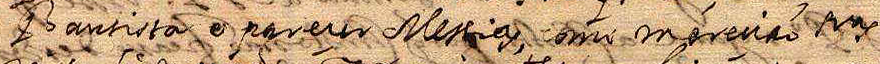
Bautista o parecer Messias, como mereciaõ suas
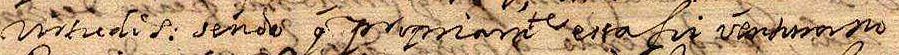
virtudes. sendo q̄ propriamte esta foi ventura no
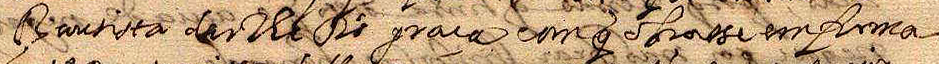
Bautista darlhe Ds̄ graça com q̄ obrasse em forma
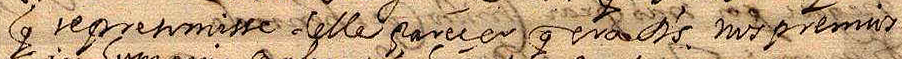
q̄ se presumisse delle parecer q̄ era Ds̄ nos premios
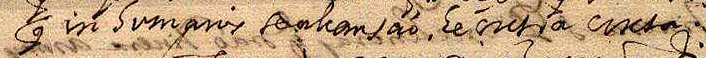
q̄ inhumanos se alcansaõ. he outra conta.
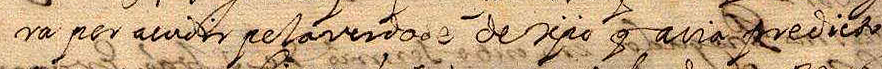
ra por acudir pela verdade de xpo q̄ avia predicto
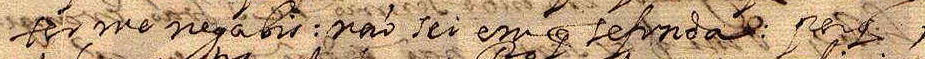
ter me negabis: naõ sei em q̄ se funda porq̄
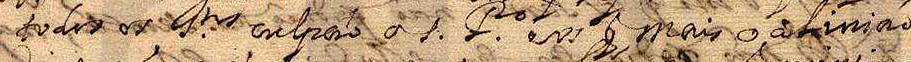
todos os s.tos culpaõ a s. P.o e os q̄ mais o aliuiaõ
